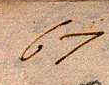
67
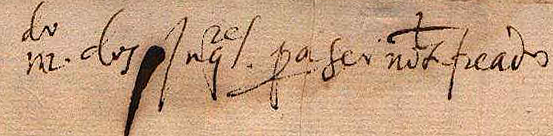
m.do dos Jnqres. ꝑa ser noteficado
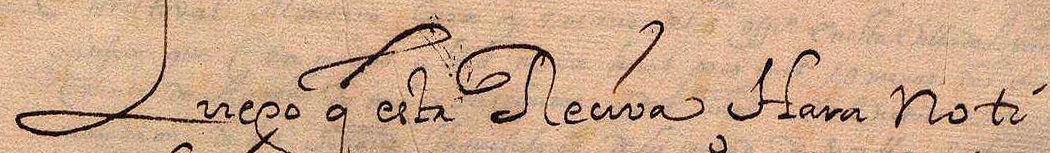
Luego q̄ esta Reciva Hara noti
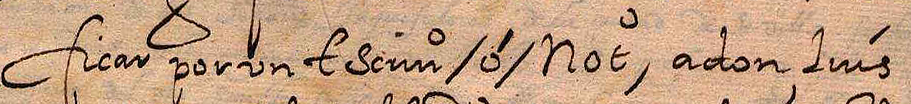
ficar por un Escriuo / ó / Noto, a don luis
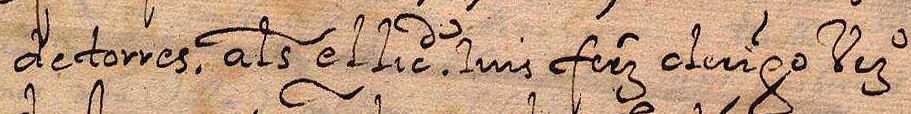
de torres āls el licdo luis ferz̄ clerigo Vezo
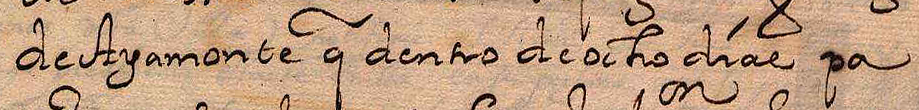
de Ayamonte q̄ dentro de ocho dias pa
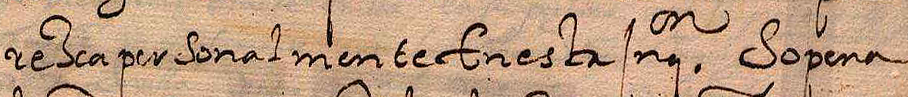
rezca personalmente En esta Jnq.on So pena
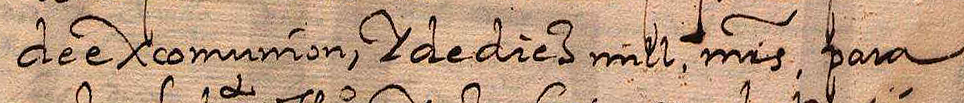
de excomunion, Y de diez mill, m̄rs, para
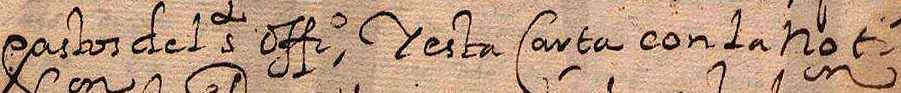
gastos del sto offio, Y esta Carta con la noti
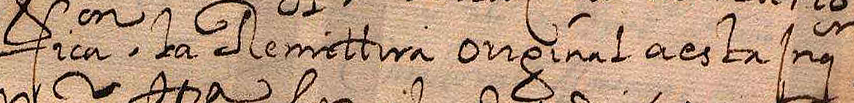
ficaon. la Remittira original a esta Jnqon
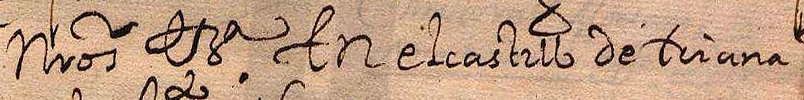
Nros̄ &a En el castillo de triana
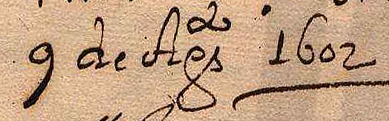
9 de Agsto 1602
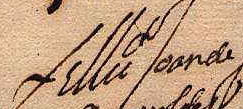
El licdo Joan de
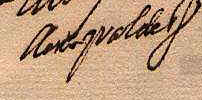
llano y valdes
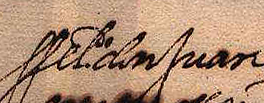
e l.do don Juan
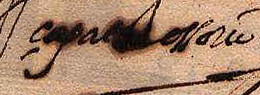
çapata ossorio
